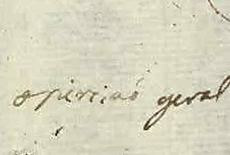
opiniaõ geral
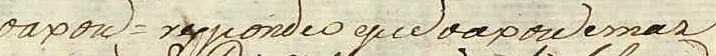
o axou = respondeo que o axou em as
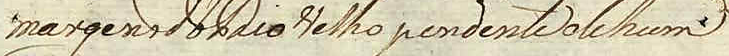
margens do Rio Velho pendente de hum
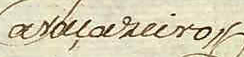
araçazeiro//
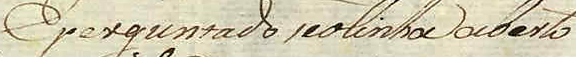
E perguntado se o tinha aberto
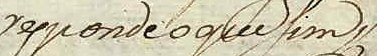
respondeo que sim//
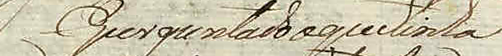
E perguntado o que tinha
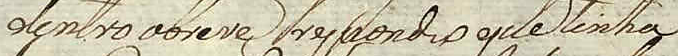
dentro o breve respondeo que tinha
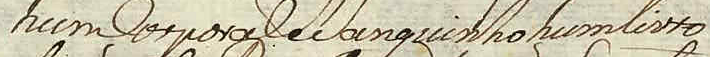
hum Corporal e Sanguinho hum livro
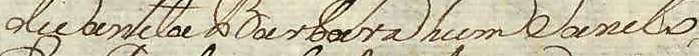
de Sancta Barbara hum Sancto
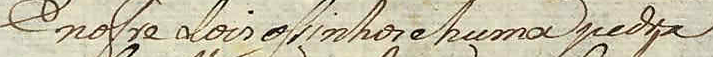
Enofre dois ossinhos e huma pedra
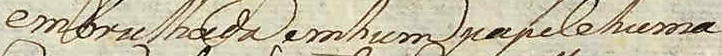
embrulhada em hum papel e huma
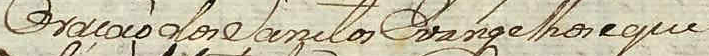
Oraçao dos Sanctos Evangelhos, e que
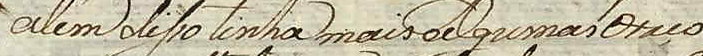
alem disso tinha mais algumas oraço
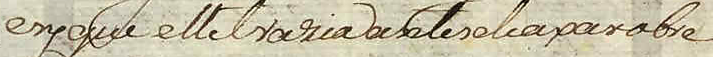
ens que elle trazia antes de axar o bre
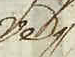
ve//
